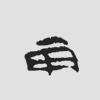雨
